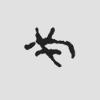弋
